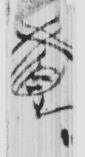{爻頁}
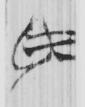𡚦
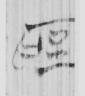聖
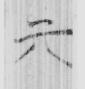亓
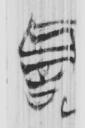詒
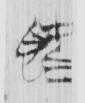既
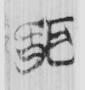䎽
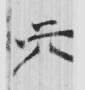亓
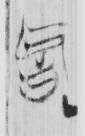詒
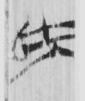𡚦
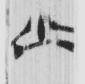少
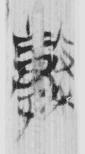{㱿子禾}
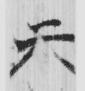亓
